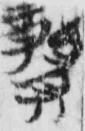贛
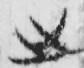之
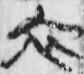衣
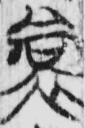裳
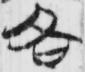各
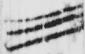三
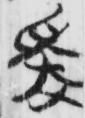爯
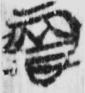巫
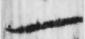一
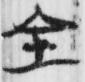全
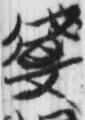○（且）
